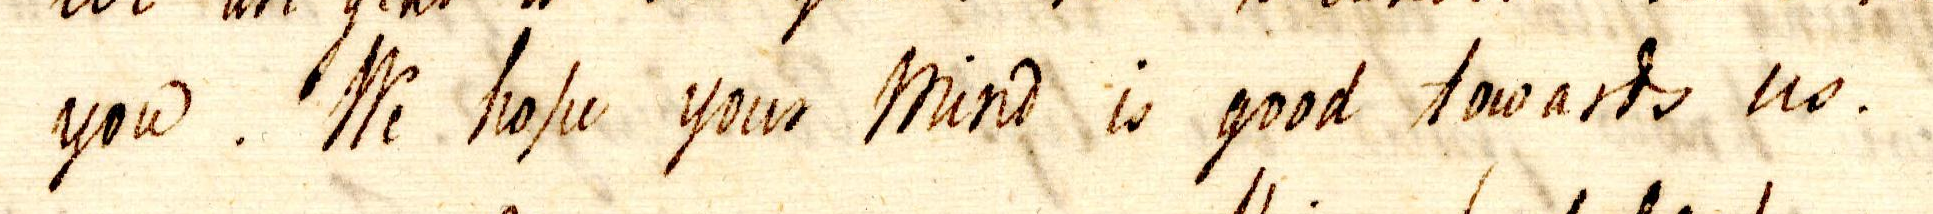you. We hope your Mind is good towards us.
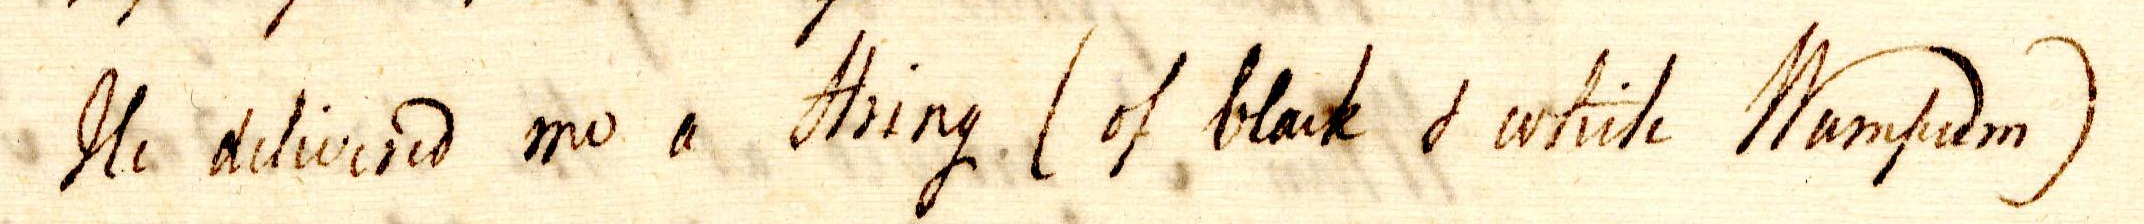He delivered me a String (of black & white Wampum)
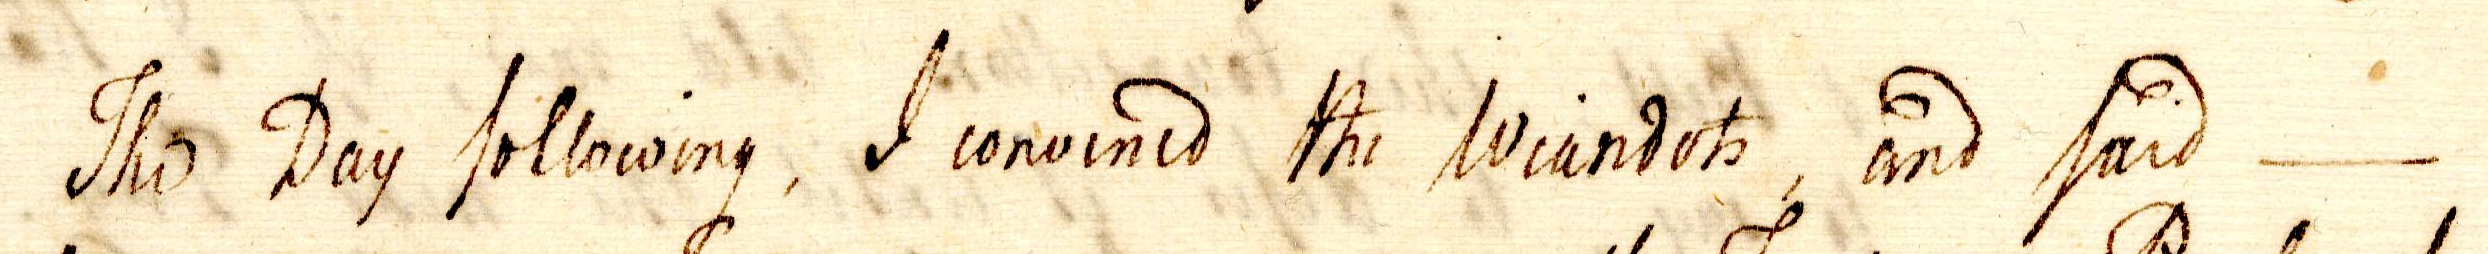The Day following, I convened the Wiandots, and said-
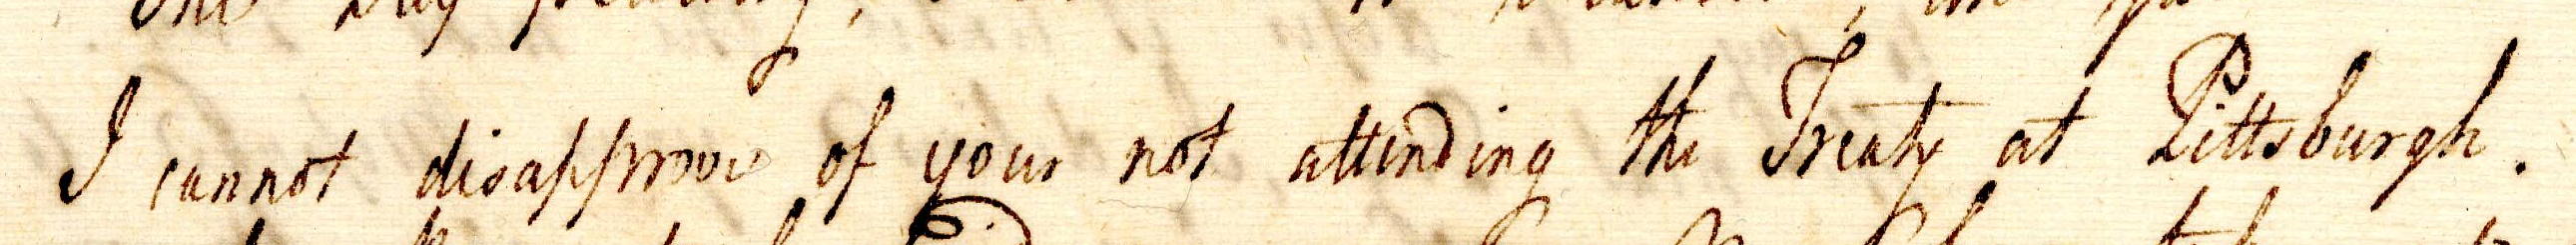I cannot disapprove of your not attending the Treaty at Pittsburgh.
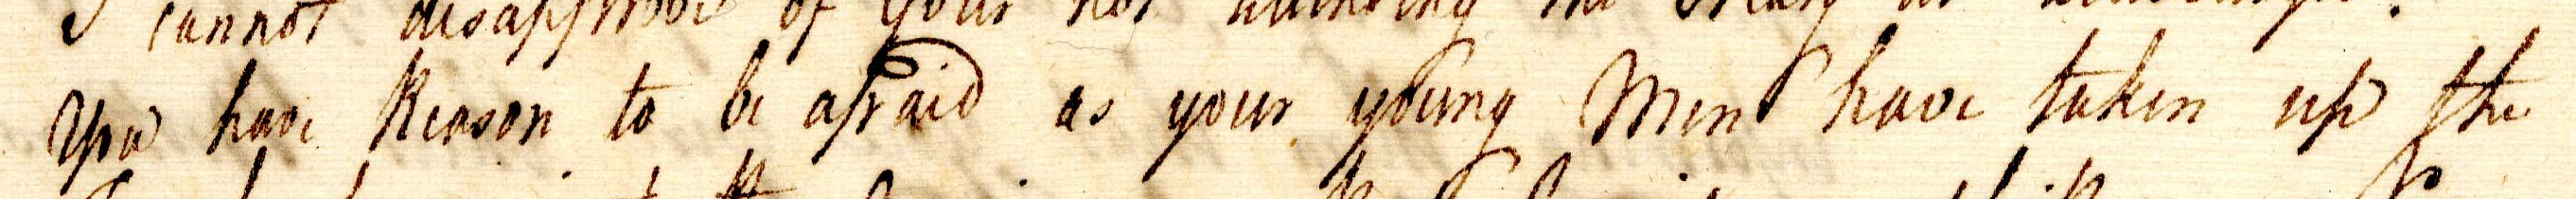You have Reason to be afraid as your young Men have taken up the
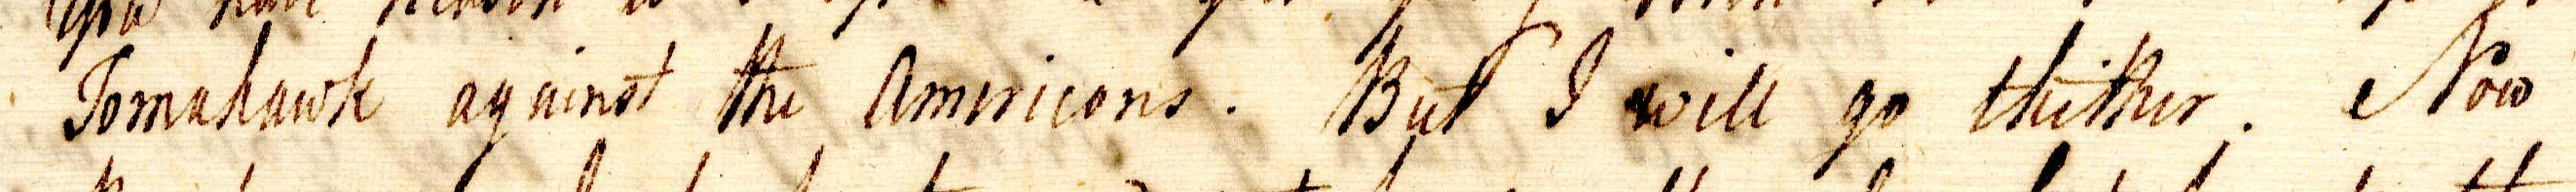Tomahawk against the Americans. But I will go thither. Now
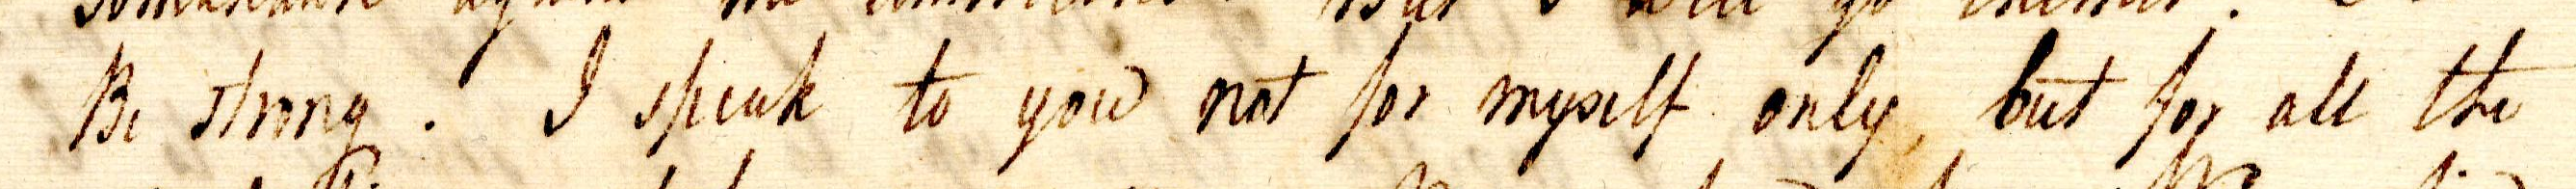Be strong. I speak to you not for myself only but for all the
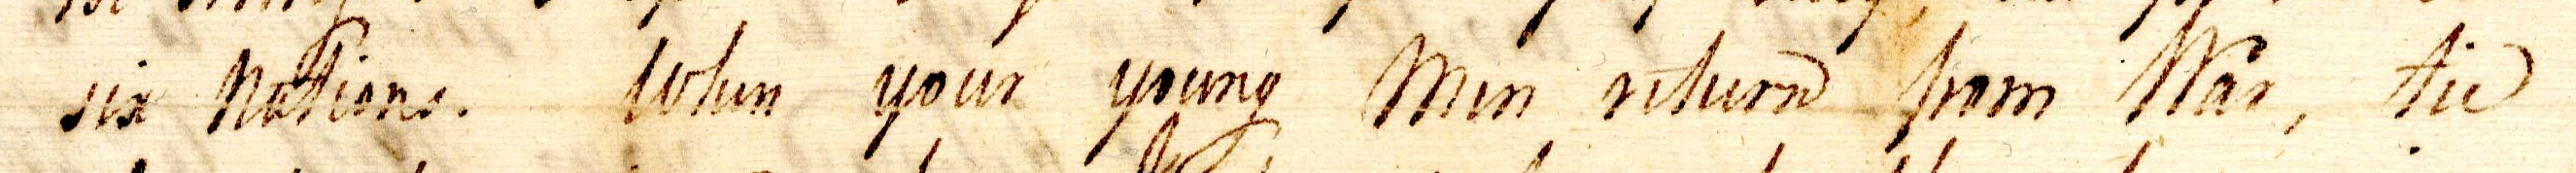six Nations. When your young men return from War, tie
